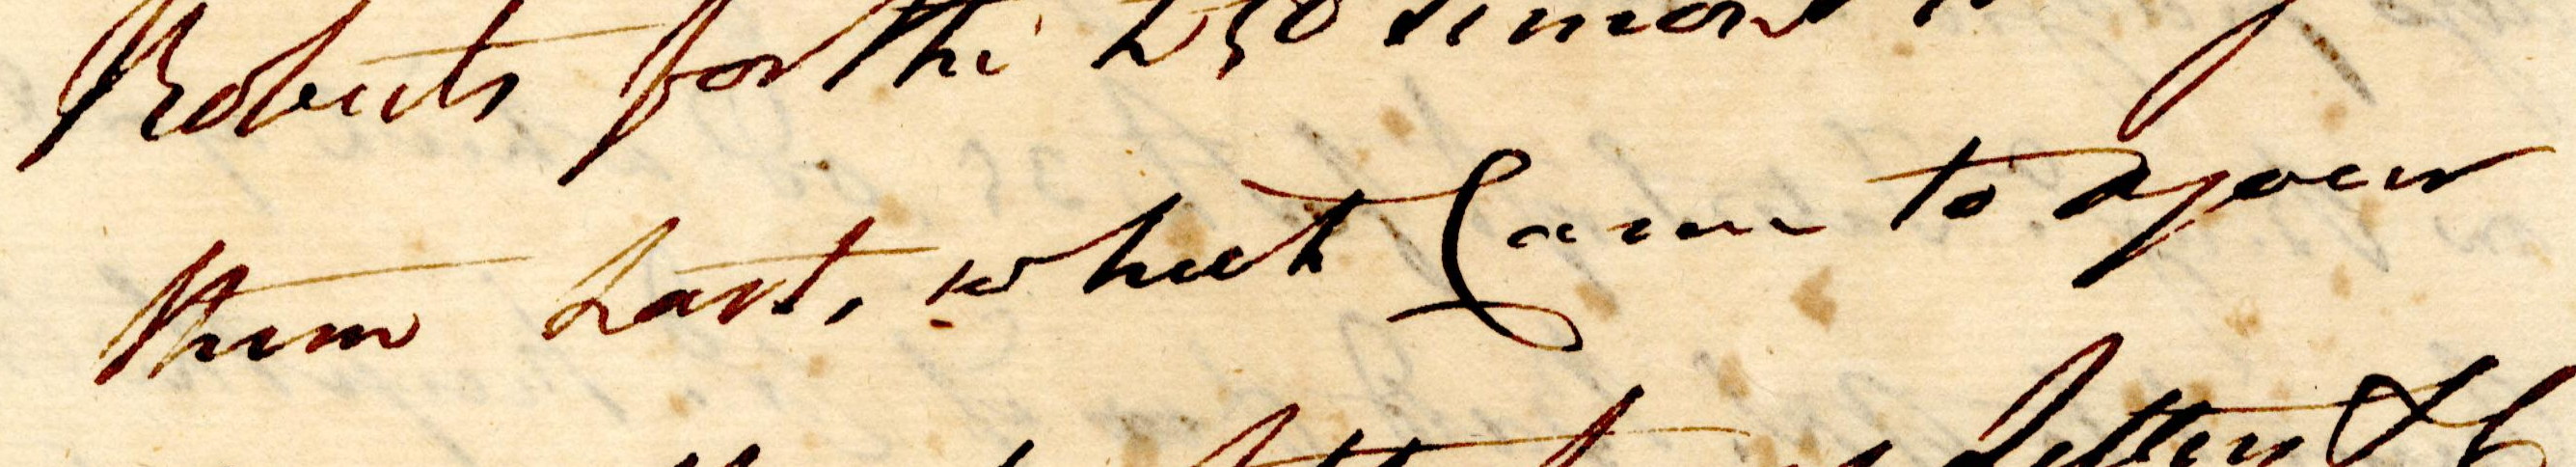them Last, which Came to your
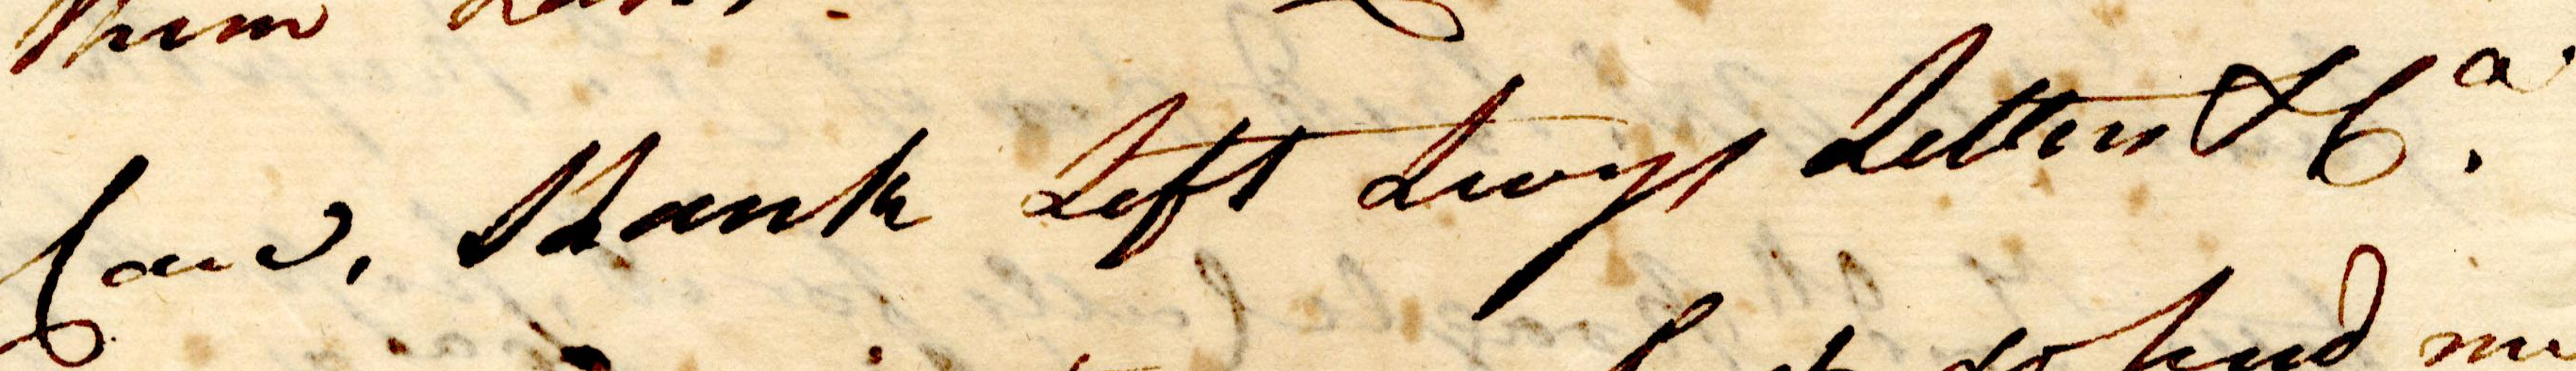Care, Shank Left Levys Letter &C^a.
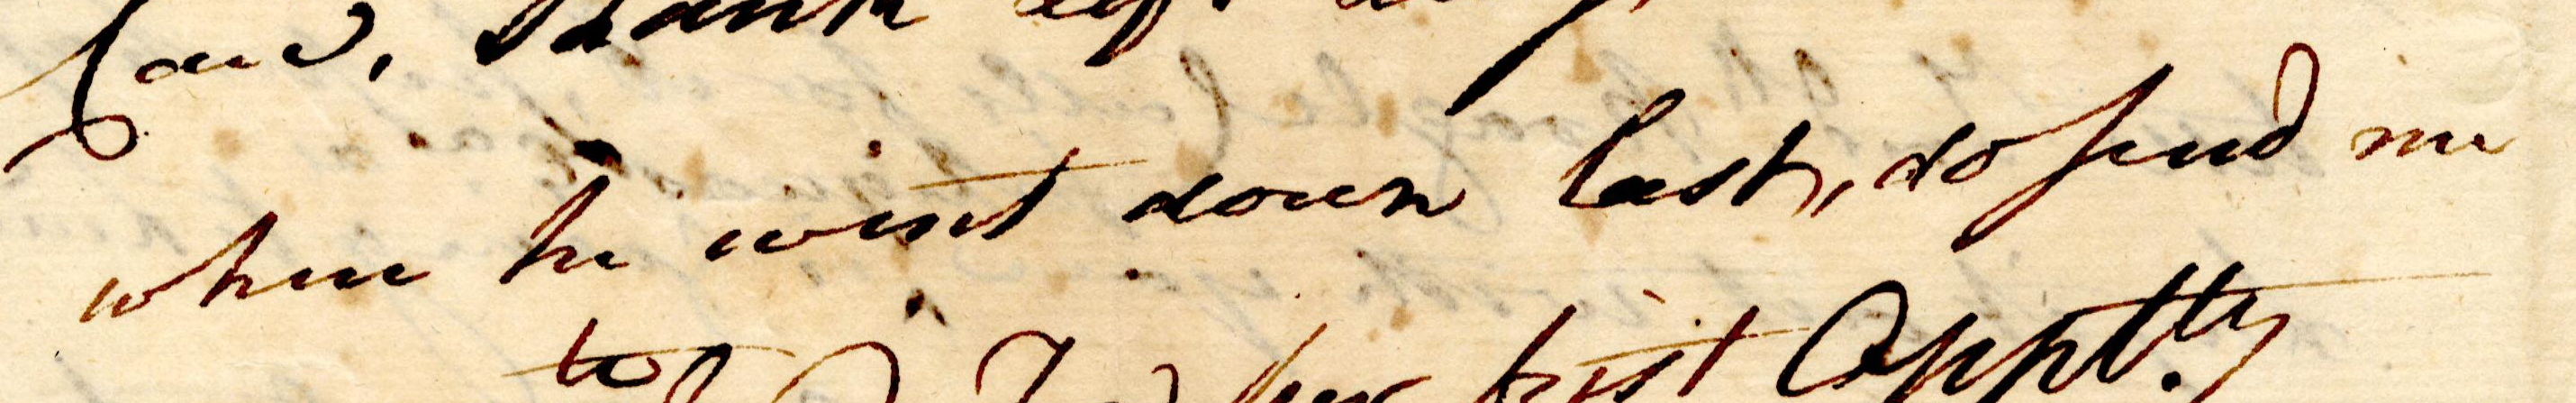where he went down last, so send me
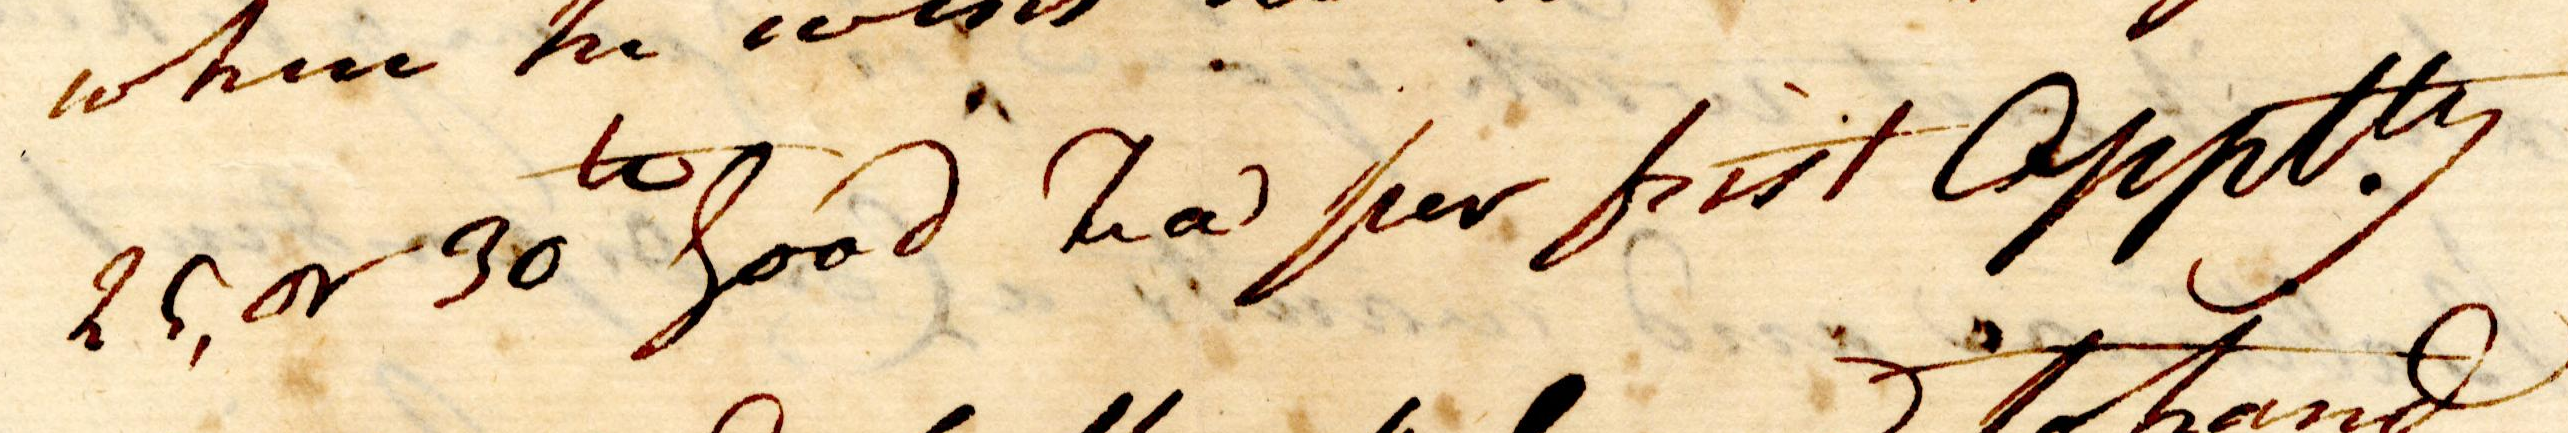25 or 30 ^lb good ha per first Opp^ty.
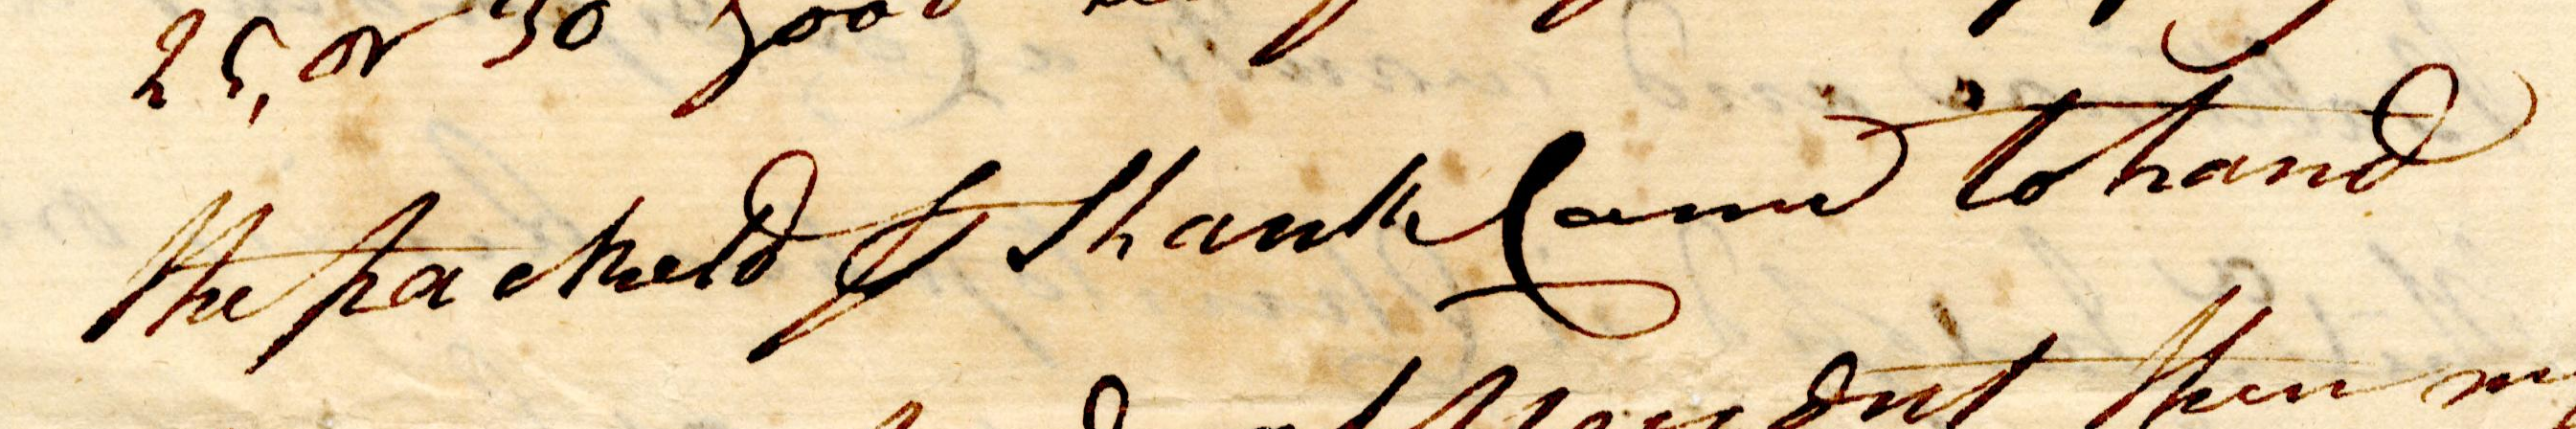the packetd per Shank Came to hand
